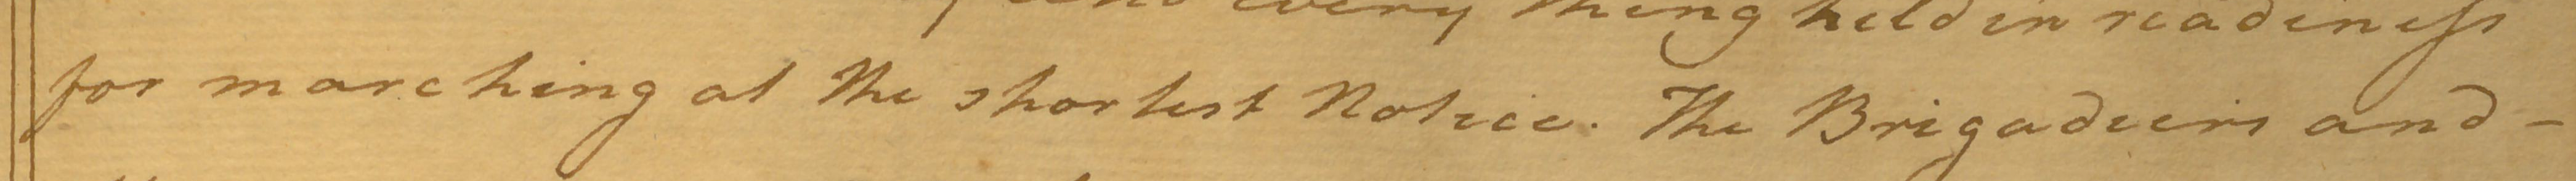for marching at the shortest notice. The Brigadiers and
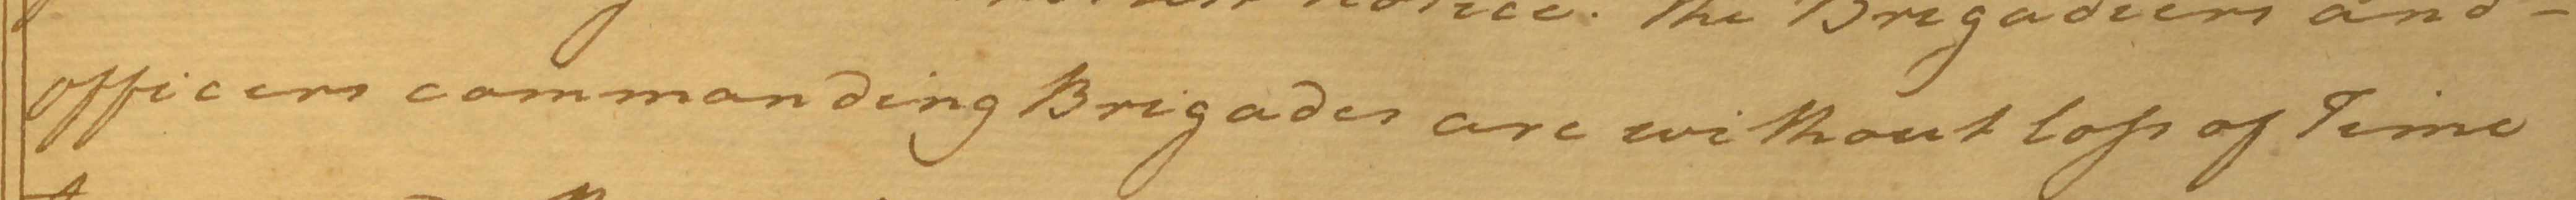officers commanding Brigades are without loss of Time
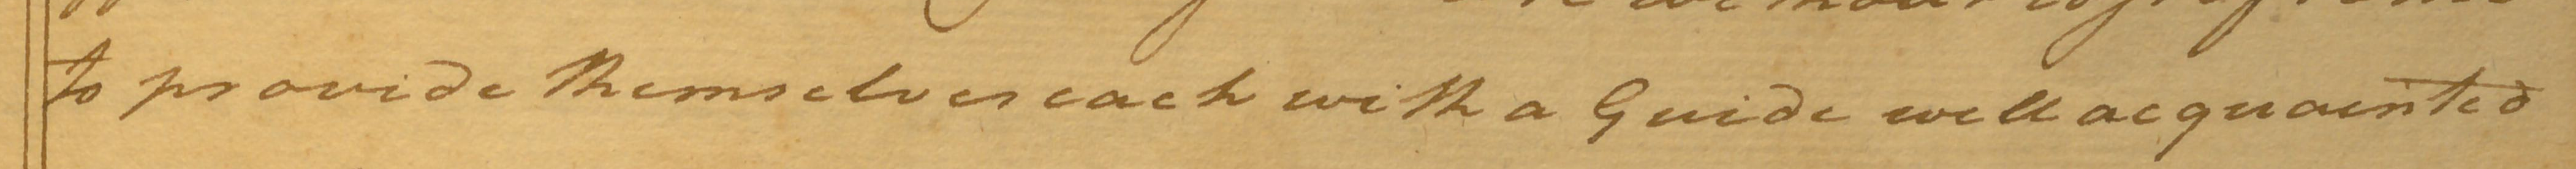to provide themselves each with a Guide well acquainted
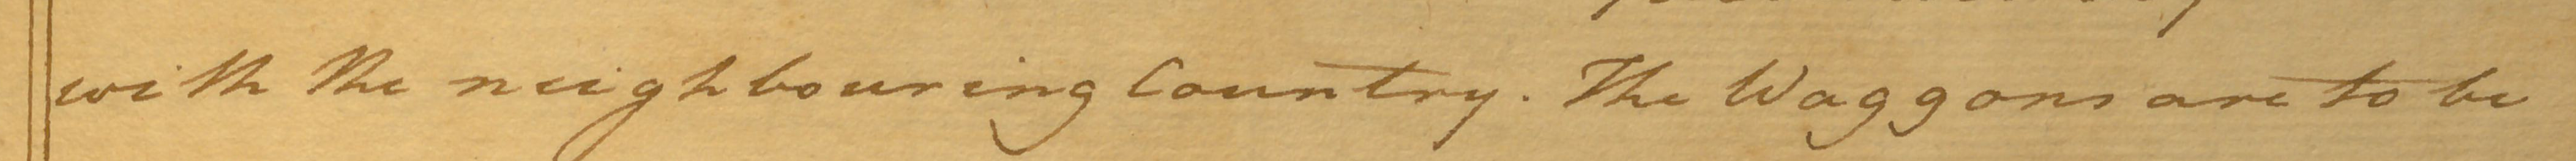with the neighbouring Country. The Waggons are to be
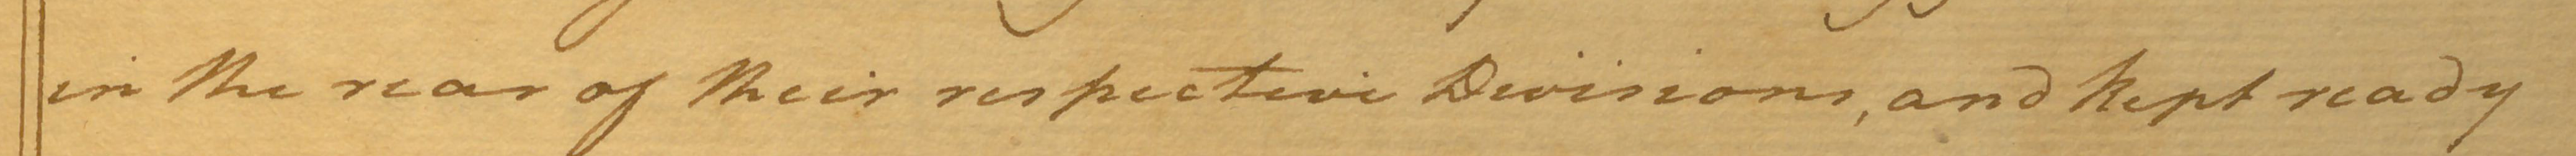in the rear of their respective Divisions, and kept ready
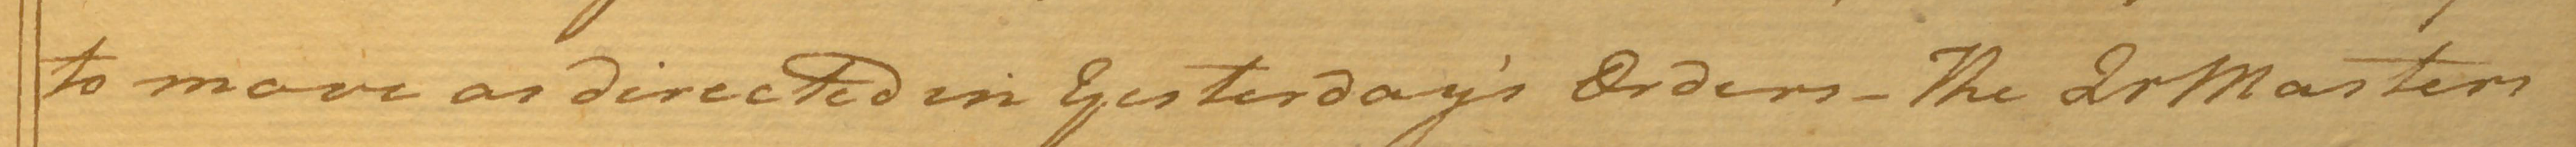to move as directed in Yesterday's Orders- The Qr masters
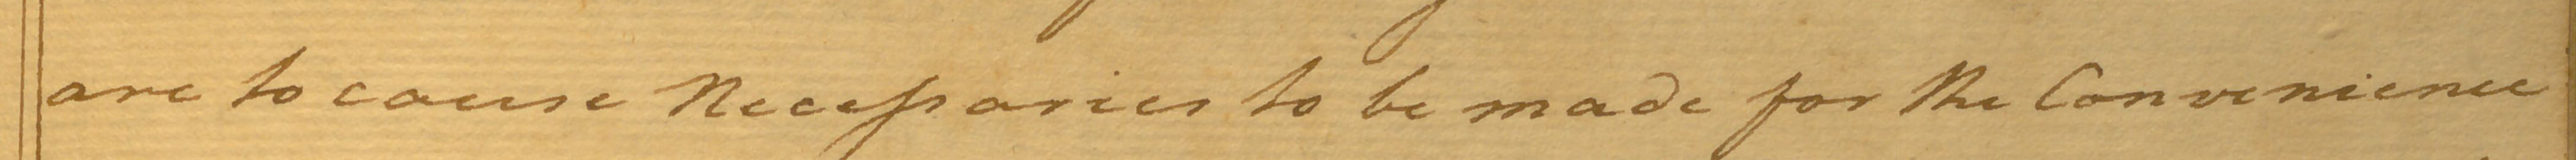are to cause necessaries to be made for the Convenience
